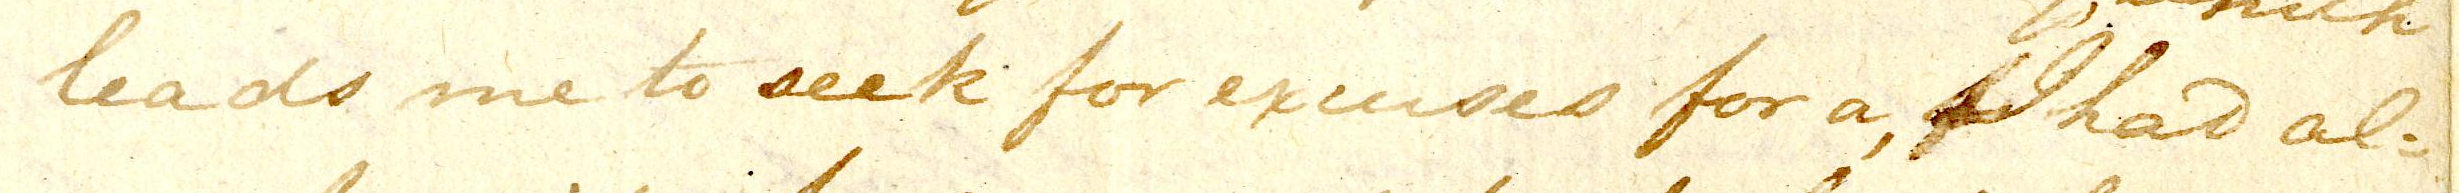leads me to seek for excuses for a, I had al-
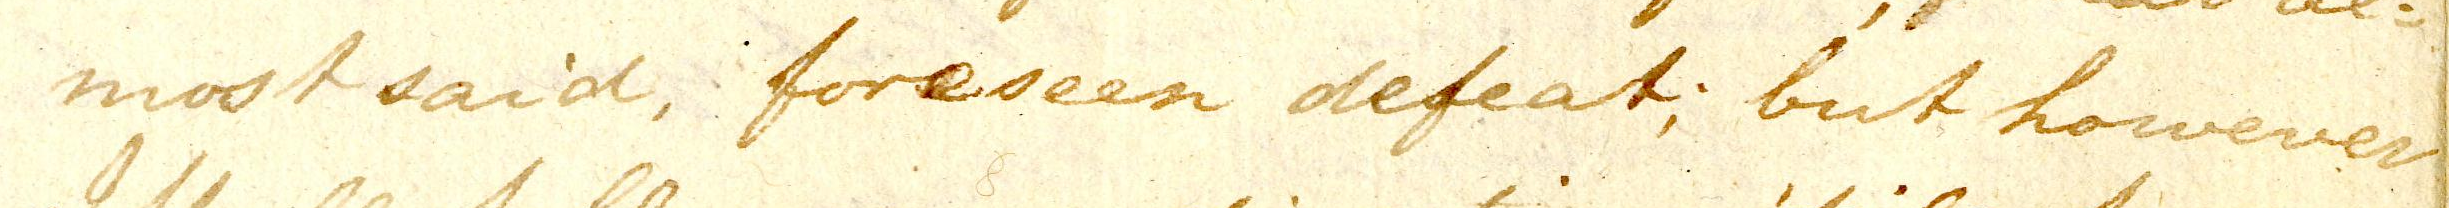most said, foreseen defeat; but however
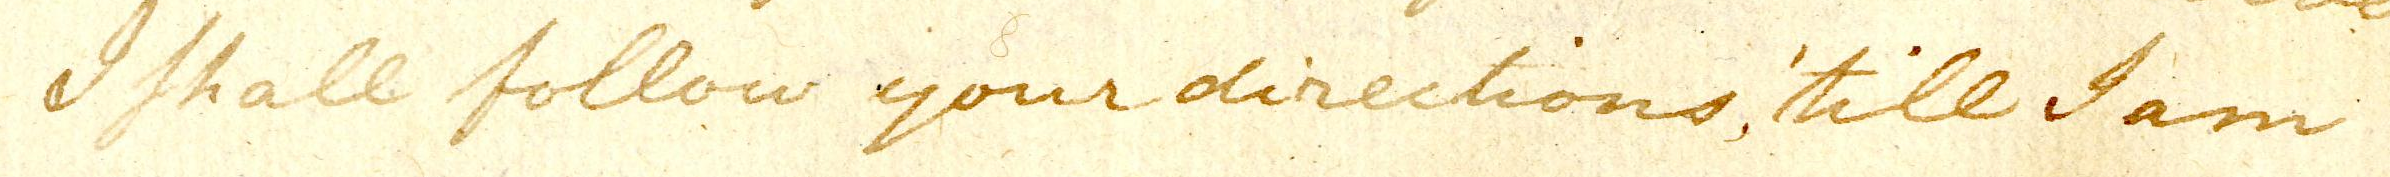I shall follow your directions, 'till I am
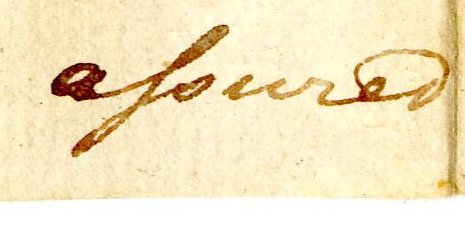assured
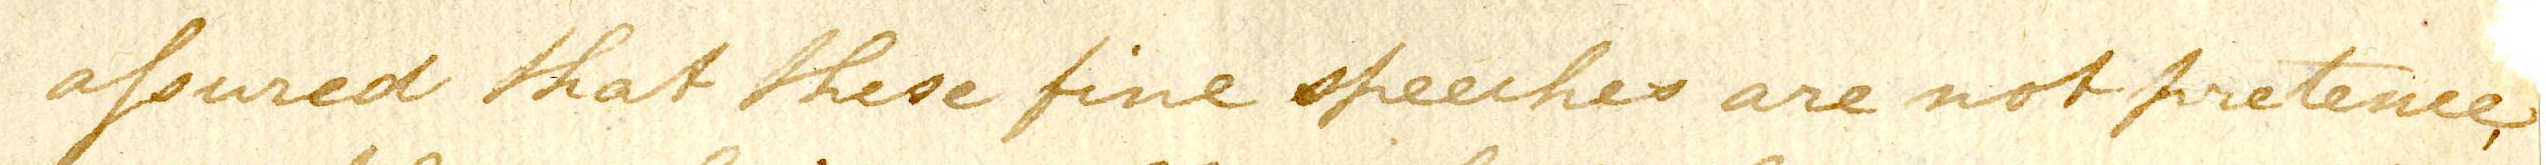assured that these fine speeches are not pretence,
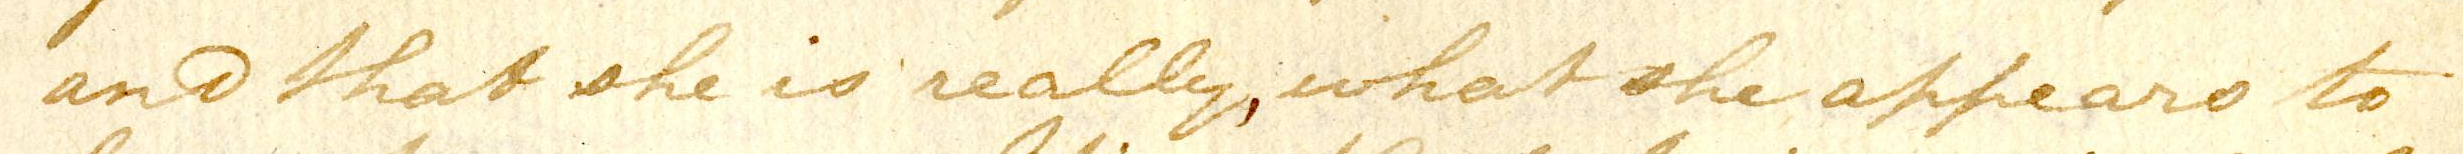and that she is really, what she appears to
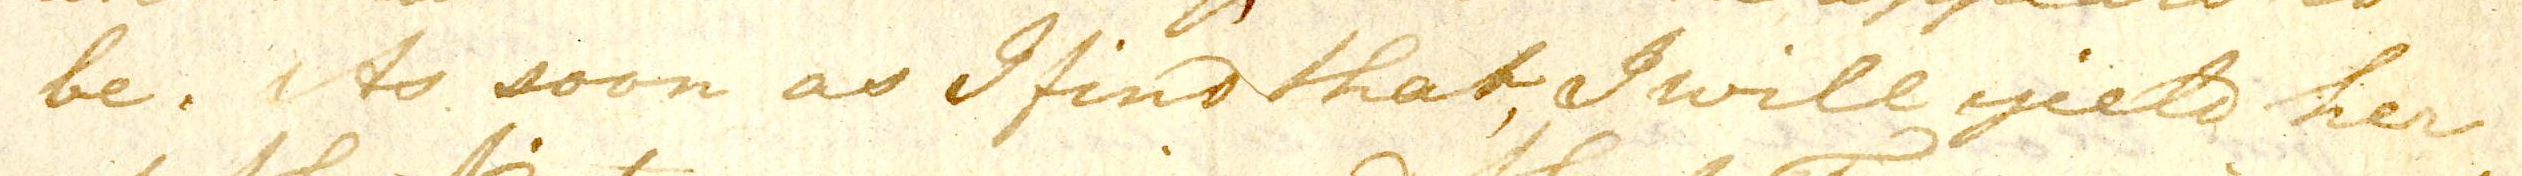be. As soon as I find that, I will yield her
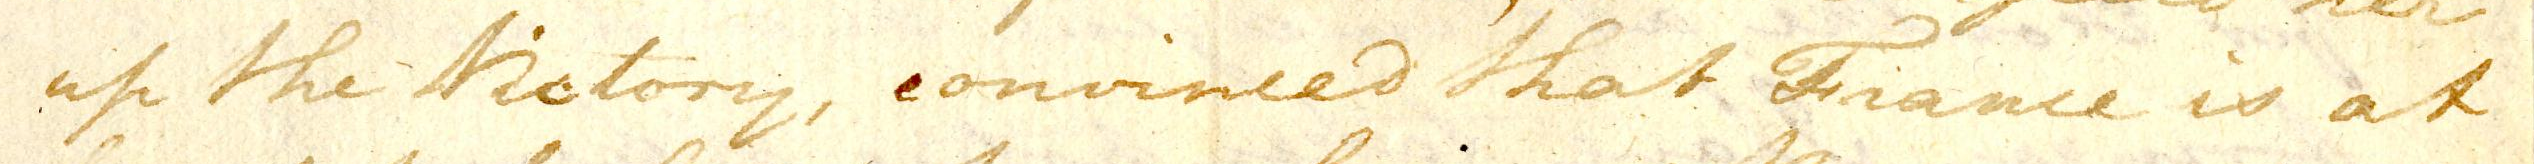p the Victory, convinced that France is at
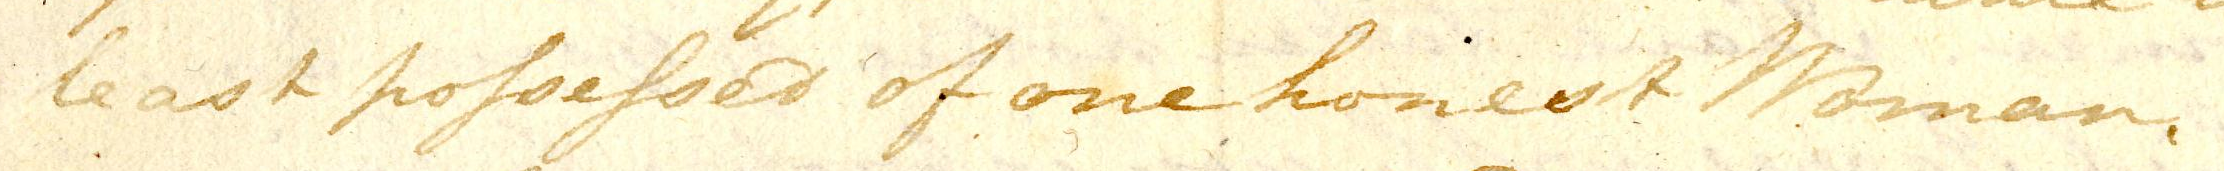least possessed of one honest Woman.
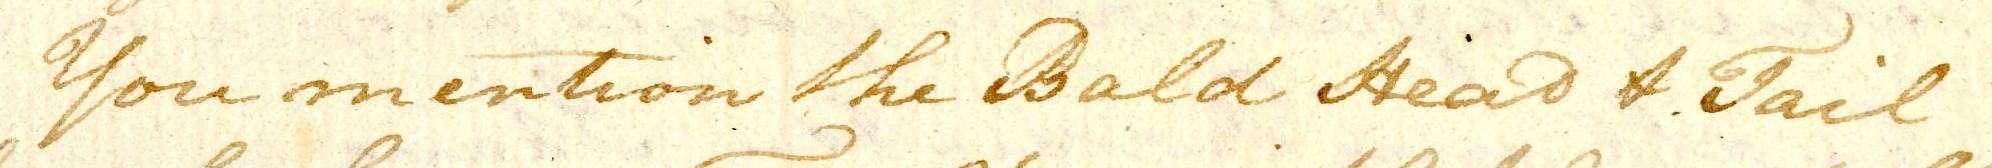You mentioned the Bald Head & Tail
